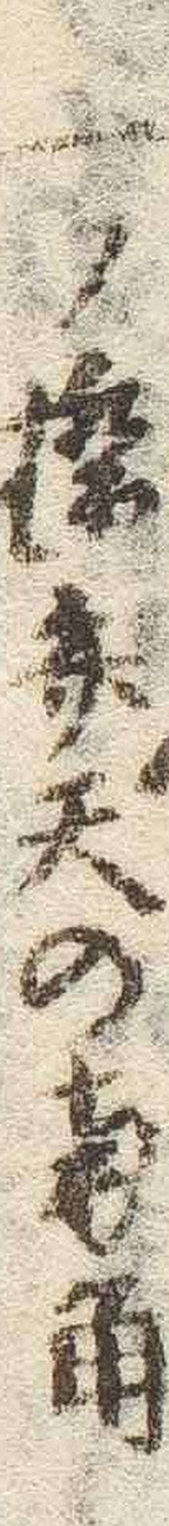一ノ橋弁天の南角
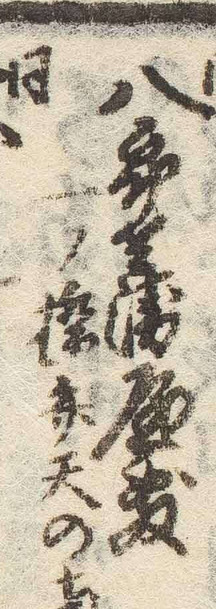八郎兵衛屋敷
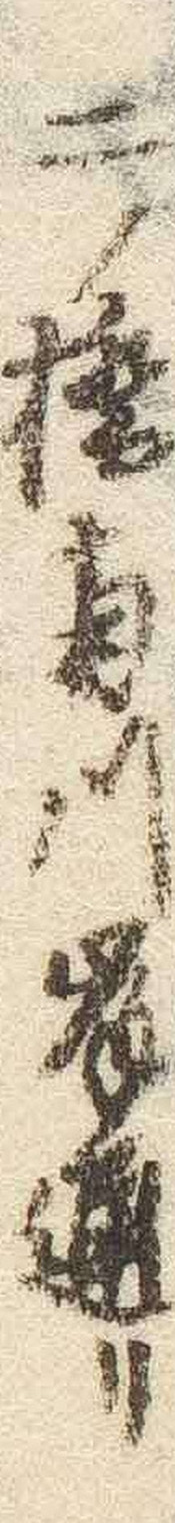二ノ橋南川岸通り
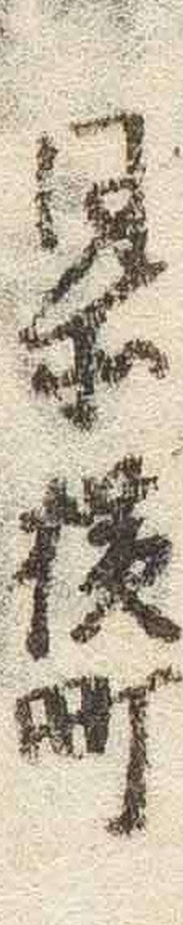同所横町
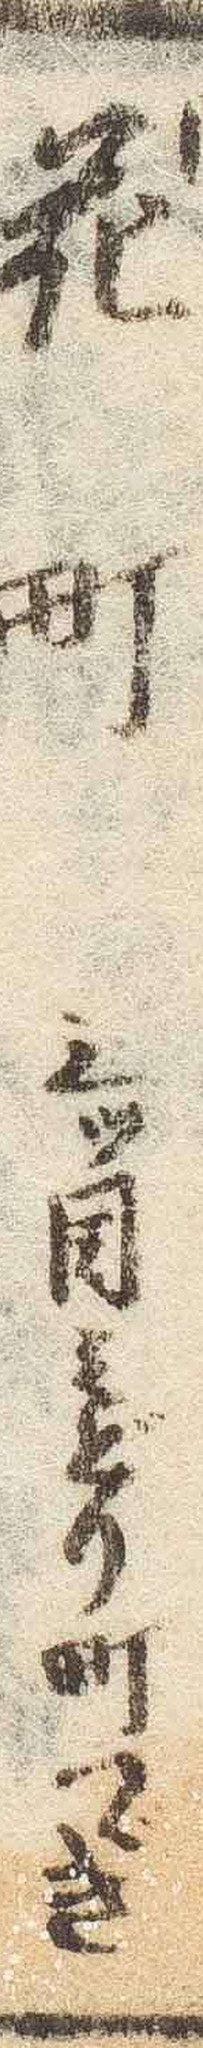花町三ッ目みどり町つゞき
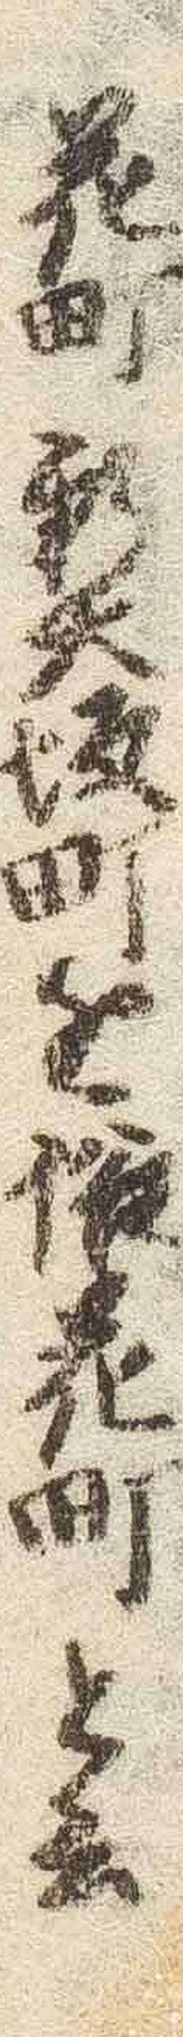花町新大坂町を俗花町と云
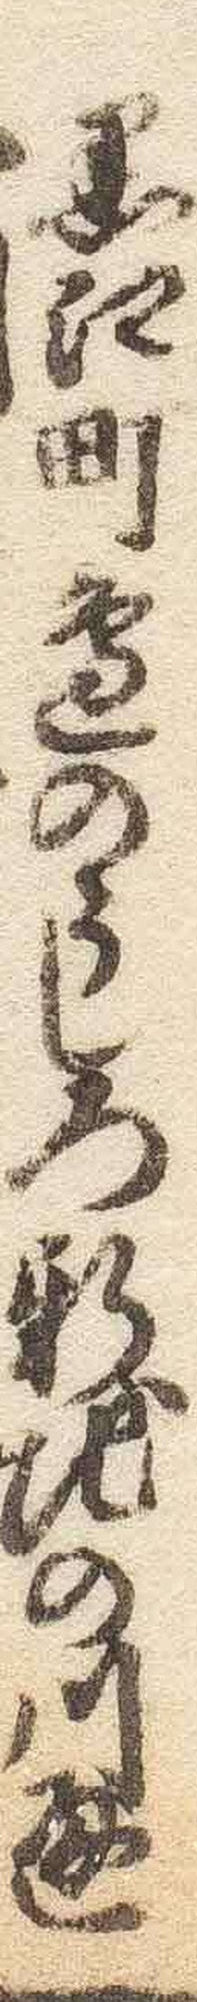黒江町辺のうしろ新地の川通
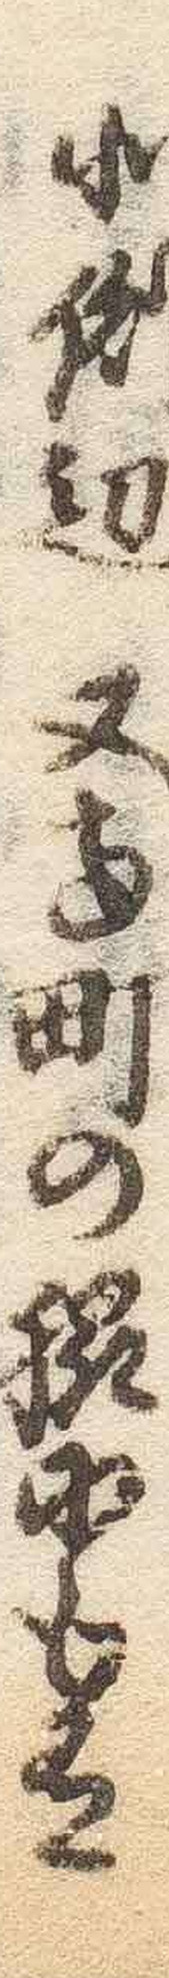北側辺又寺町の脇にも有
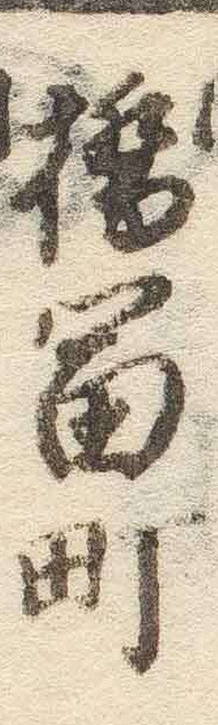橋場町
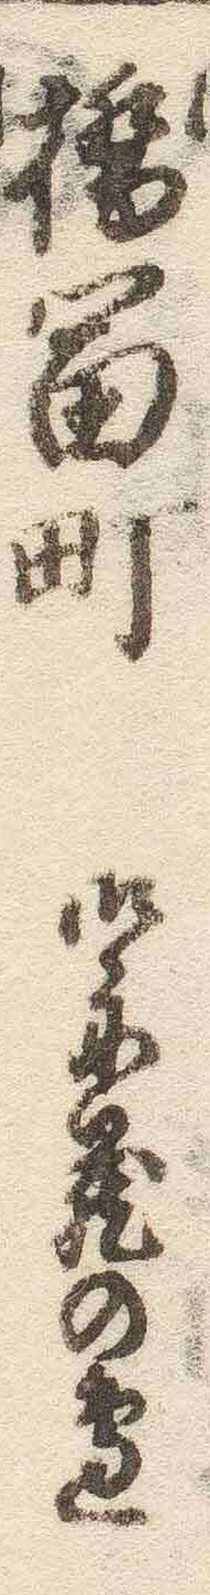橋富町御舟蔵の辺
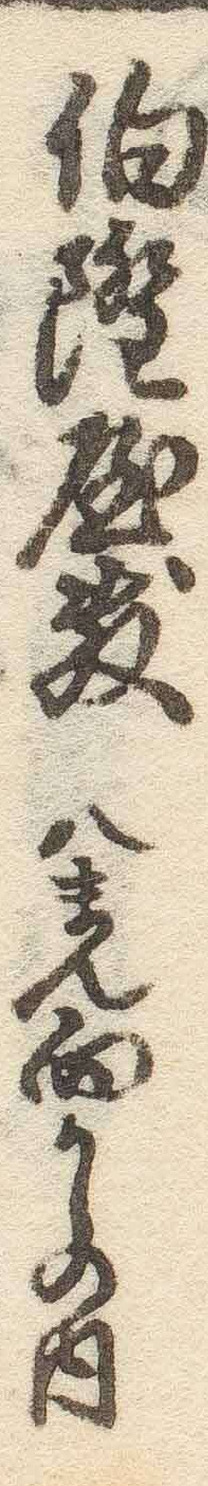伯隆屋敷八まん向かしの内
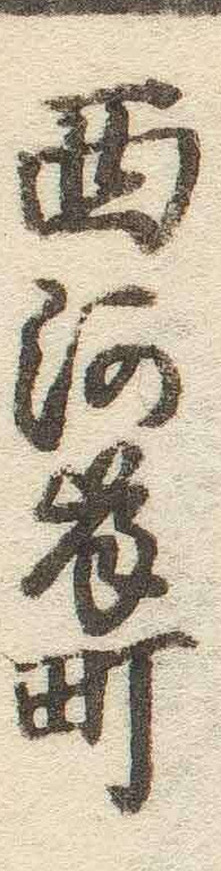西河岸町
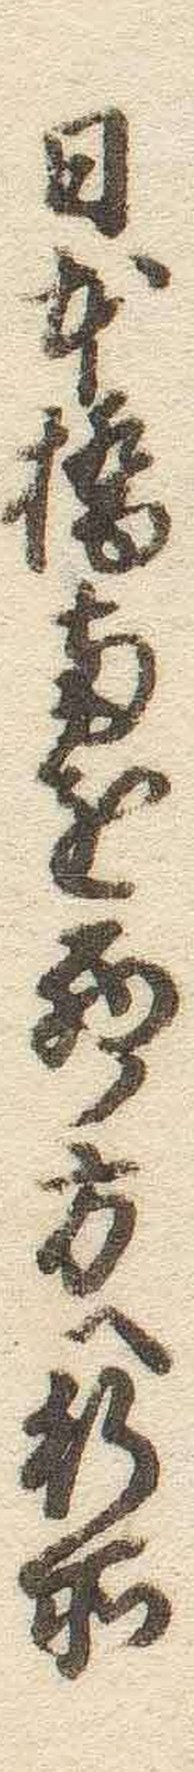日本橋南を西ノ方へ行所
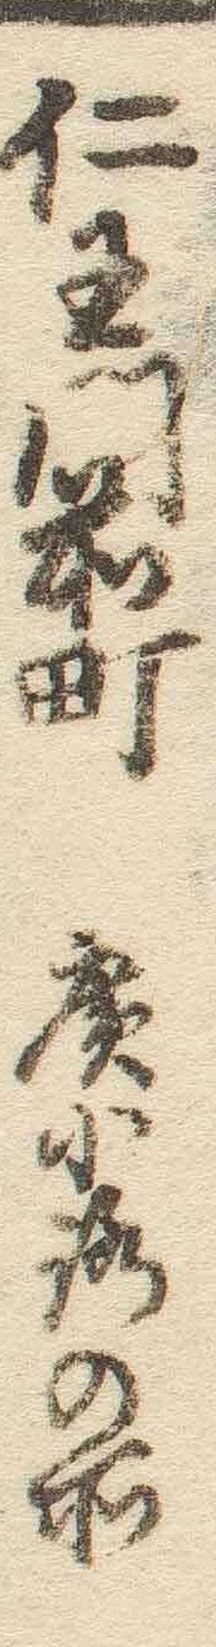仁王門前町広小路の所
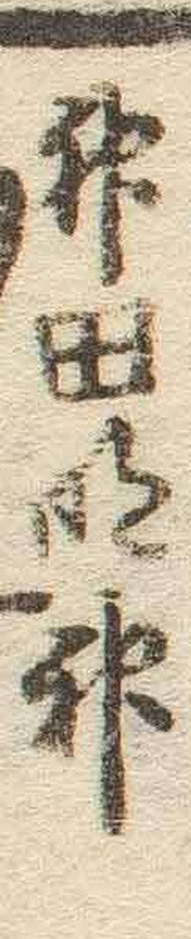神田明神

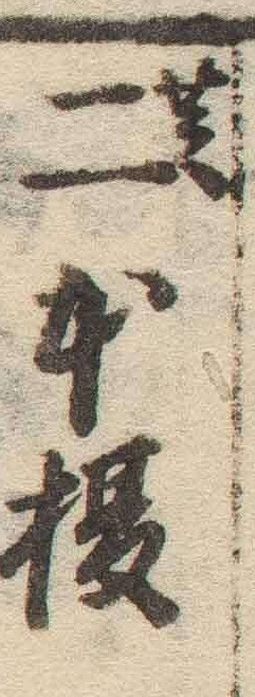二本榎
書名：江戸町独案内
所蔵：東京学芸大学附属図書館 国文学研究資料館
